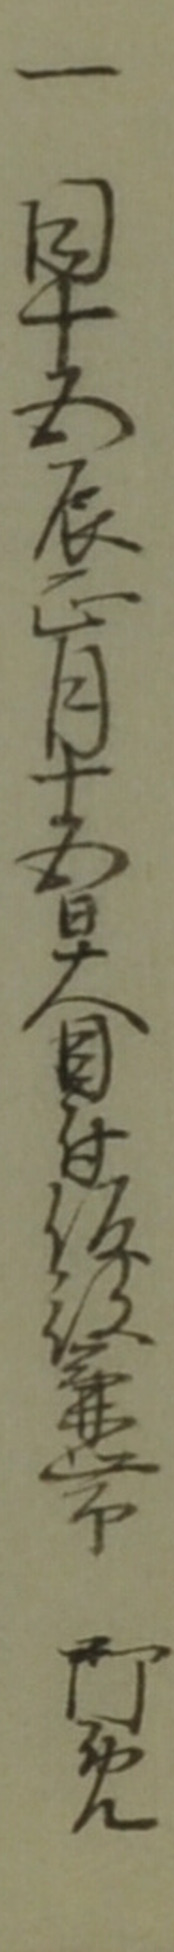一同十五辰正月十五日大目付仮役兼帯御免
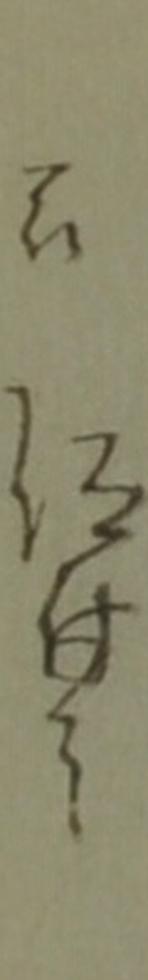被仰付之
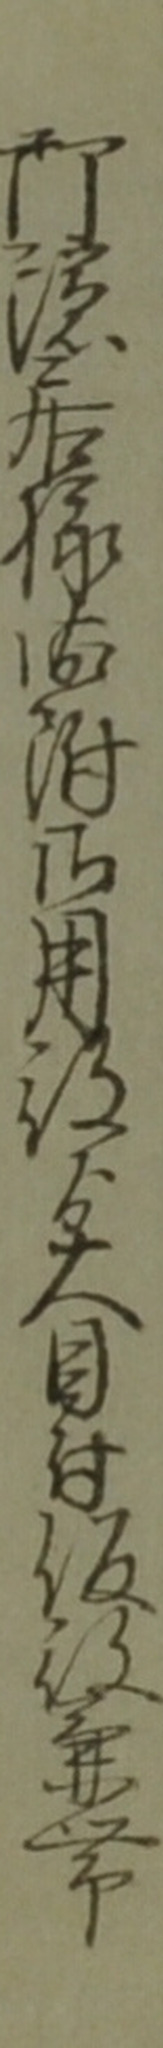御隠居様御附御用役ゟ大目付仮役兼帯
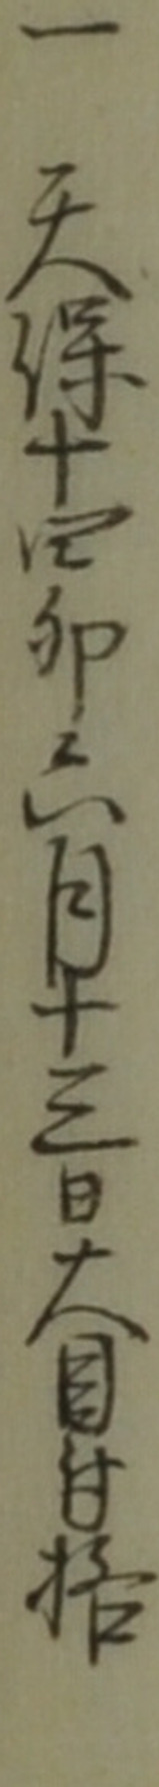一天保十四卯六月十三日大目付格
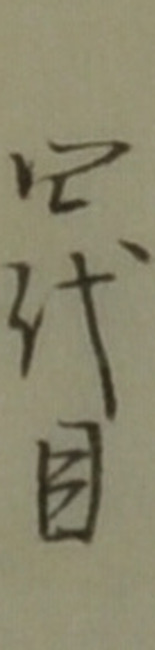四代目
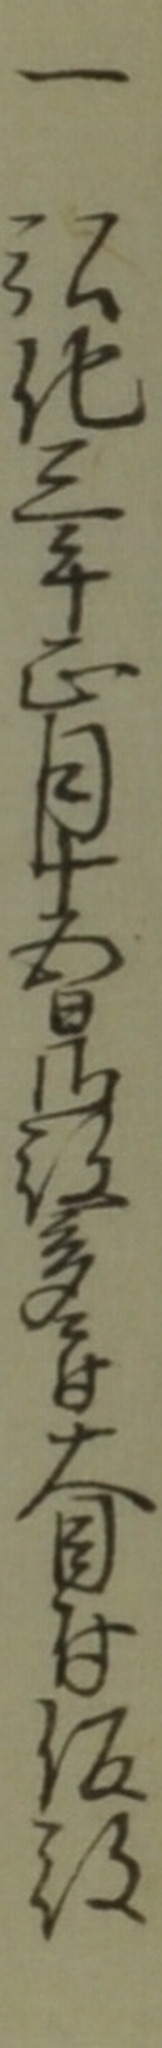一弘化三午正月十五日御役多ニ付大目付仮役
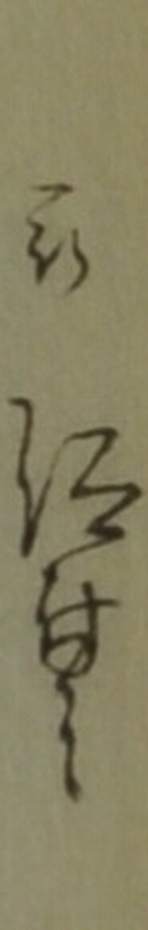被仰付之
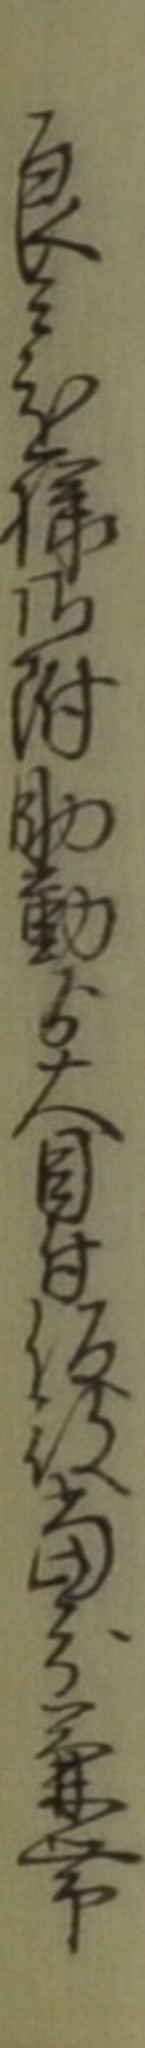良之進様御附助勤ゟ大目付仮役当分兼帯
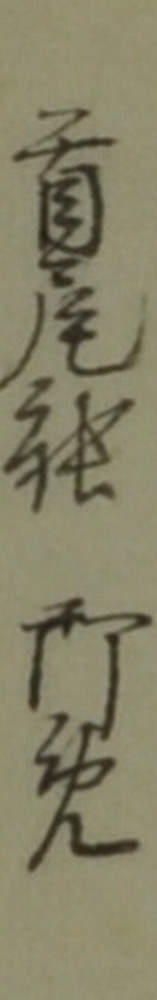首尾能御免
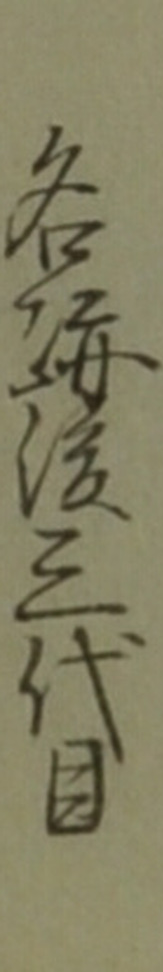名跡後三代目
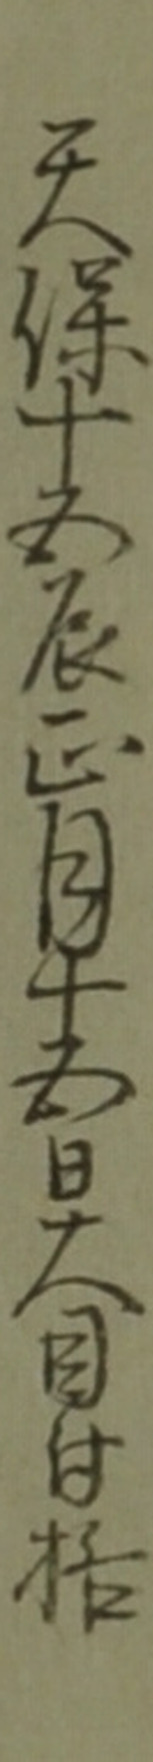一天保十五辰正月十五日大目付格
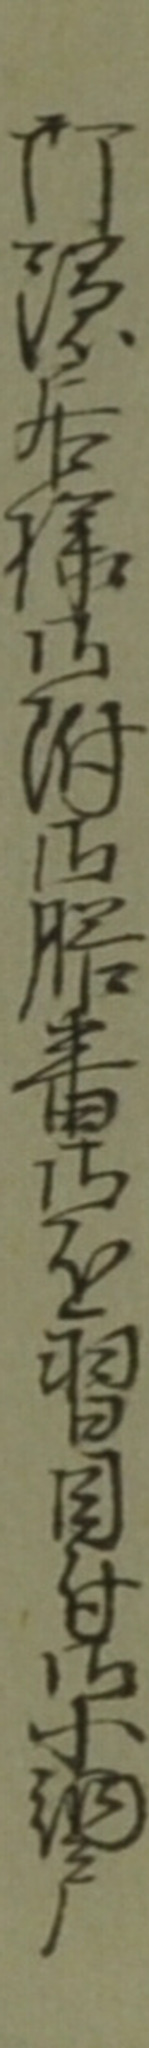御隠居様御附御膳番御近習目付御小納戸
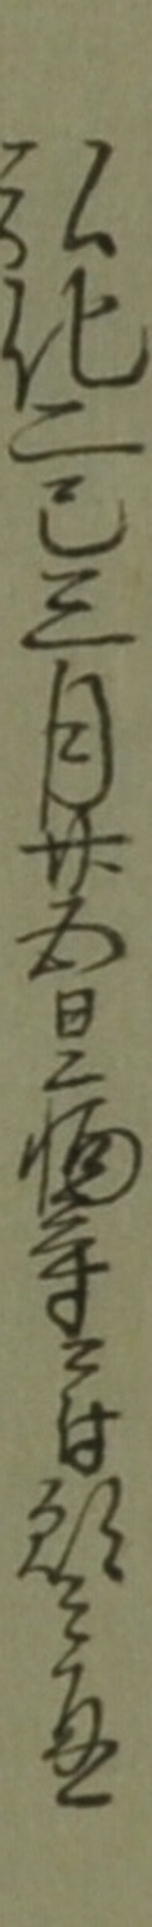一弘化二巳三月廿五日病気ニ付願之通
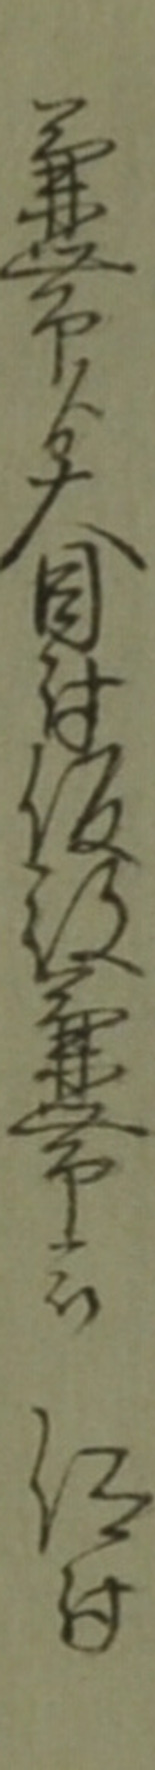兼帯ゟ大目付仮役兼帯被仰付
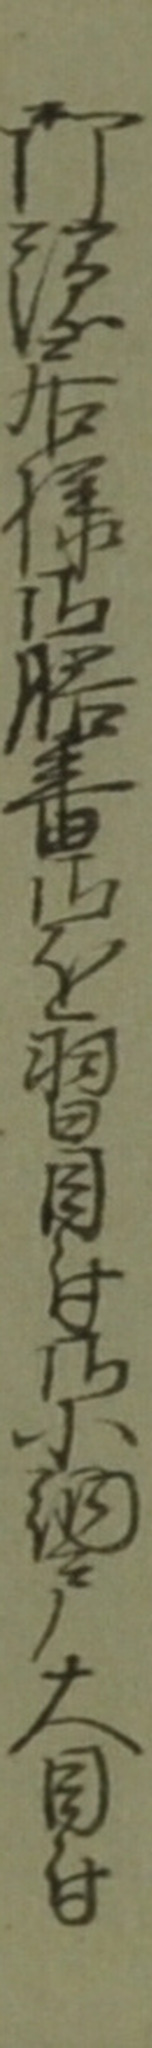御隠居様御膳番御近習目付御小納戸大目付
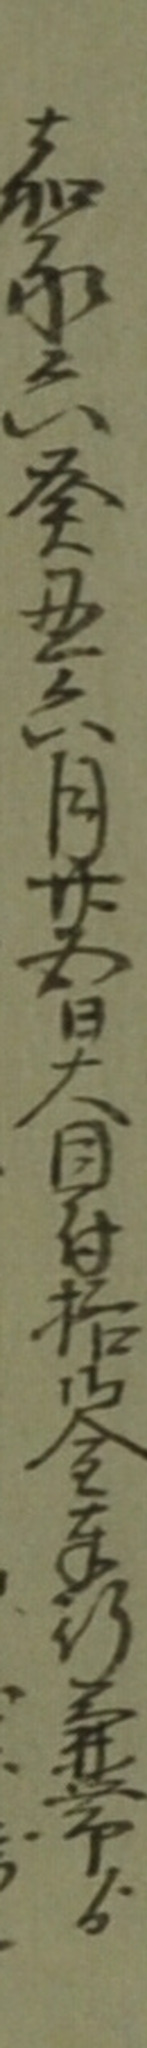一嘉永六癸丑六月廿五日大目付格御金奉行兼帯ゟ
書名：諸御役代々録（三）
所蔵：伊那市立高遠町図書館・合同会社AMANE
